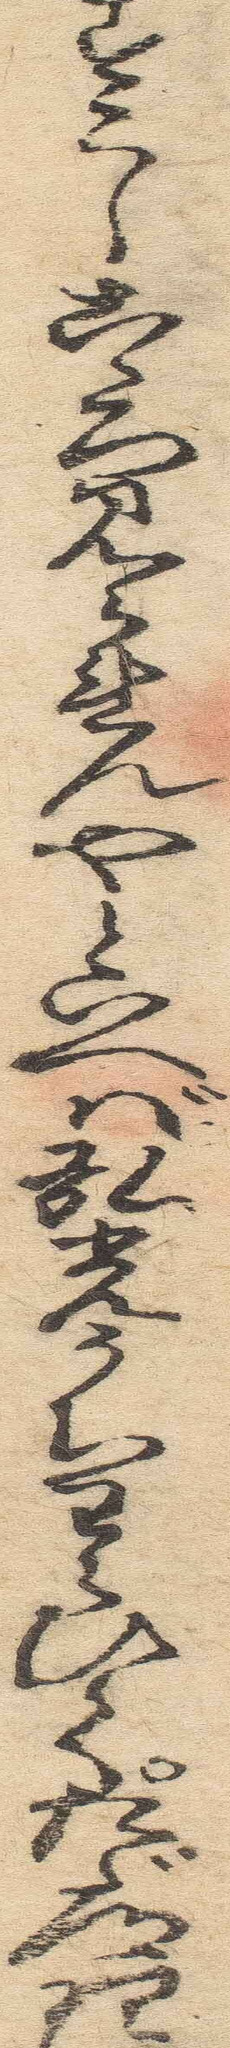すこしこゝろみられんやといへば。弘光うちわらひて。たゞ道理
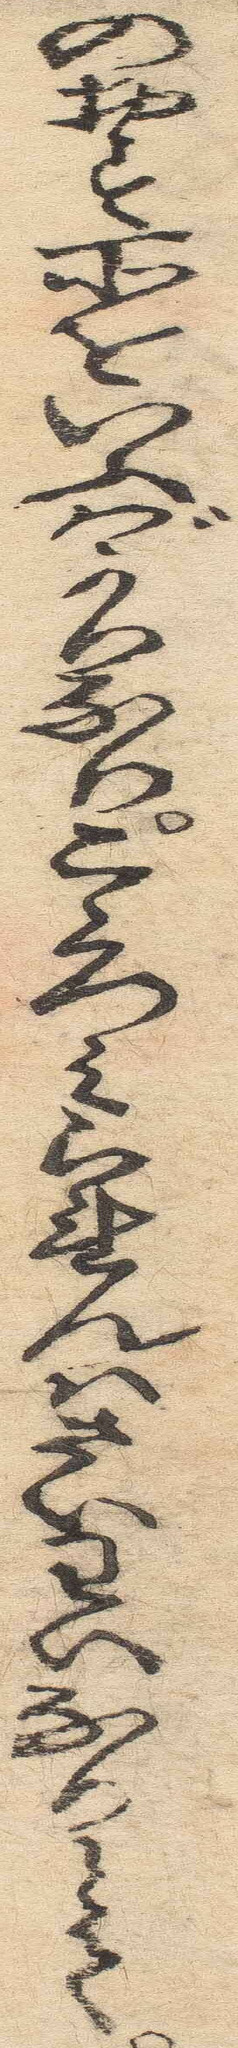のおす所をいふばかりなり。こゝろみられんはさいわいなりとて。
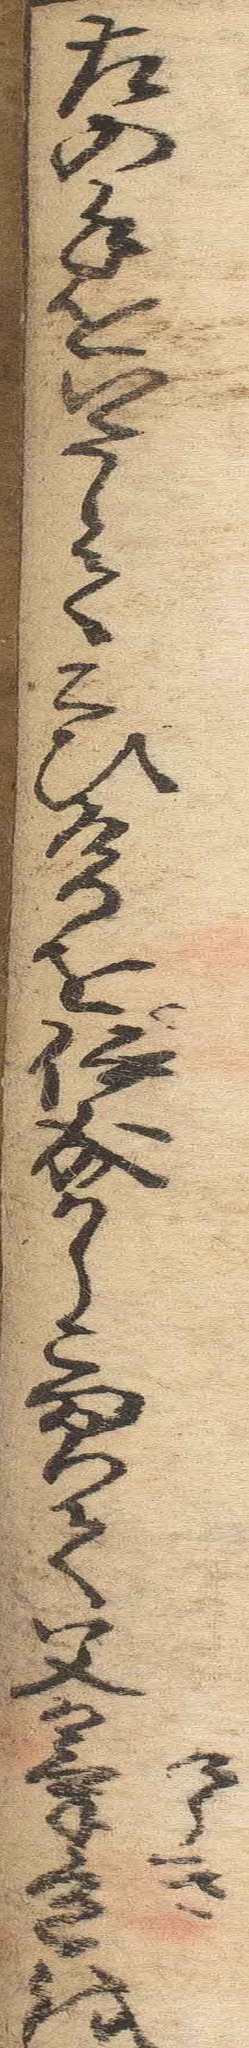左の手をいたしてこひけるを伊成かしこまりて父か景色を
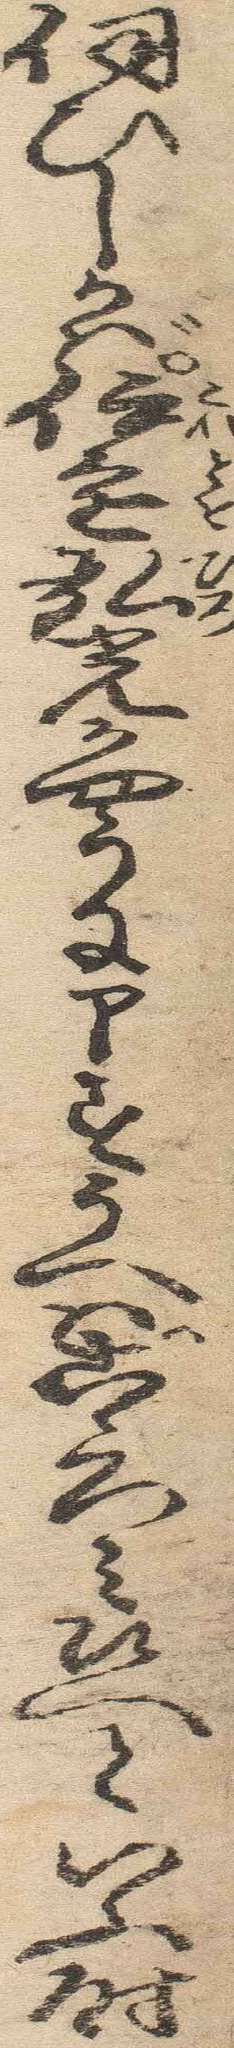伺ひしかば。伊遠弘光かやうに申すうへは。こゝろみ候へといふ時
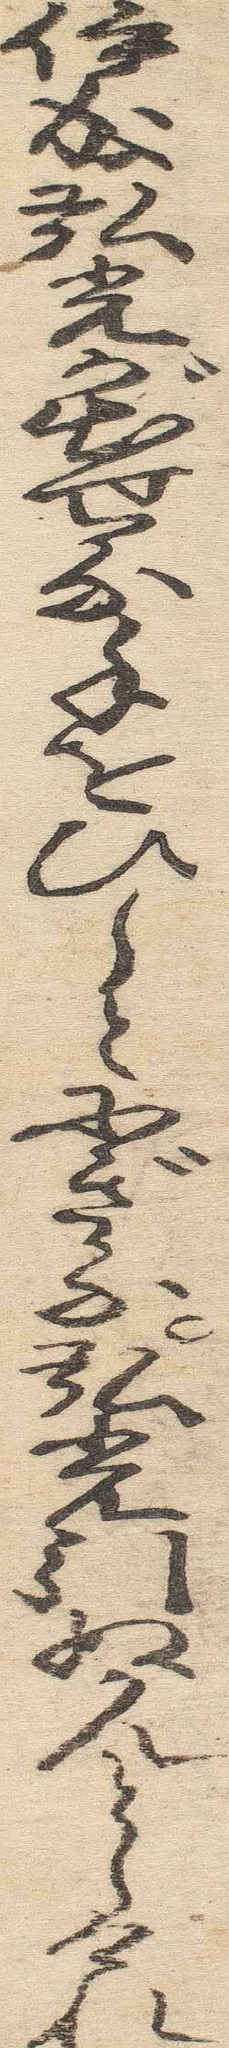伊成弘光が出せる手をひしとにぎる。弘光引ぬかんとしけれ
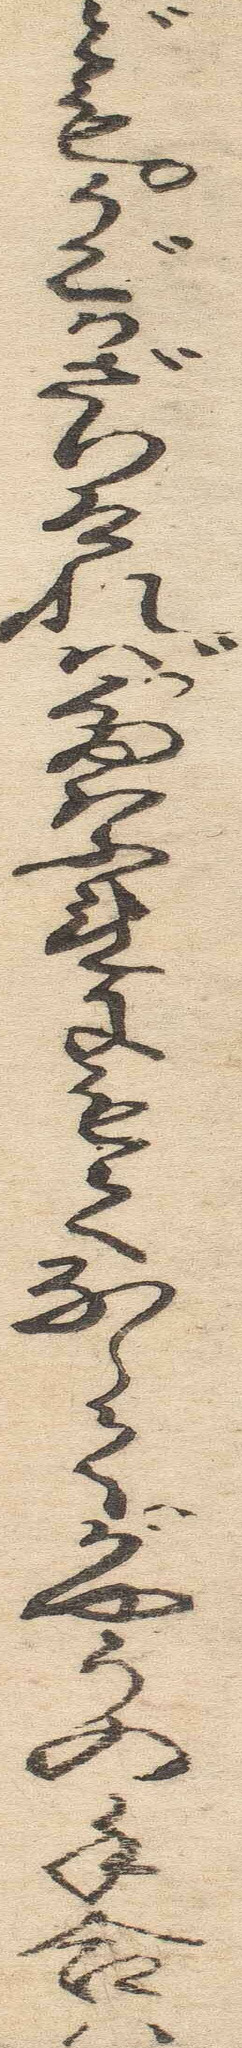ども。うごかざりければ。たはぶれにもてなして。かやうの手合は
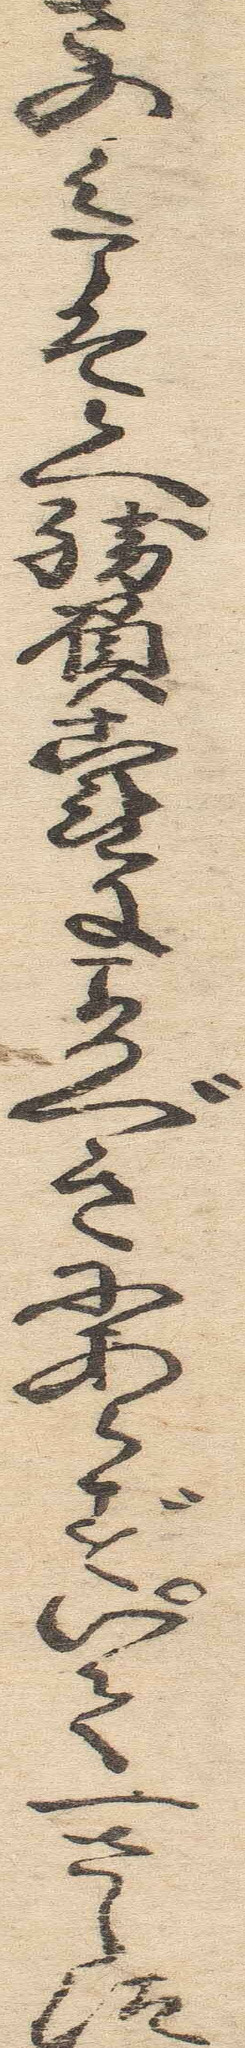さのみこそ候へ勝負これによるべきにあらず。いて一さしつ
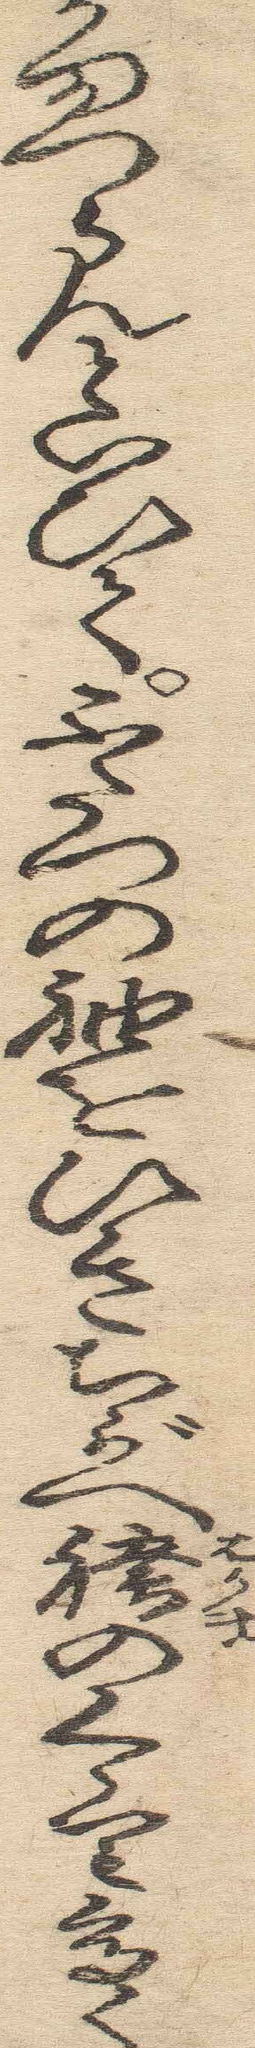かまつらんといひて。ふたつの袖をひきちがへ袴のくゝり高く
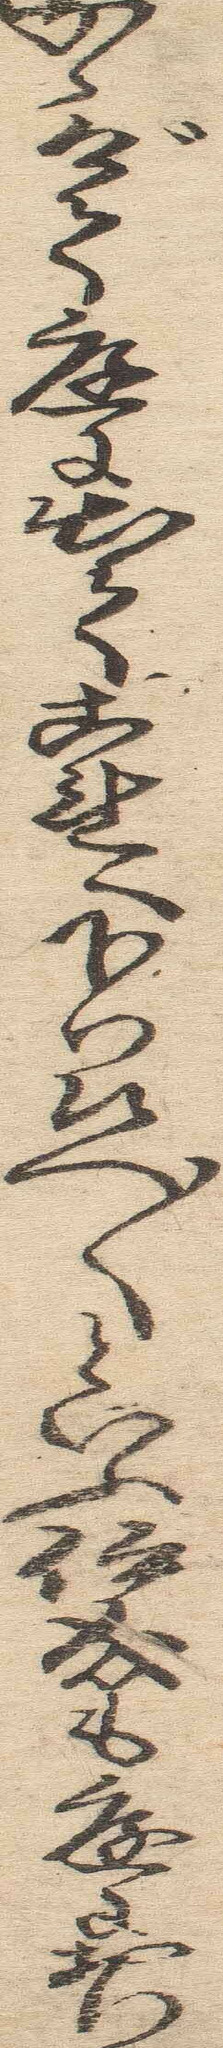かゞげて庭に出てこれへ下り候へ〳〵といふ伊成も庭におり
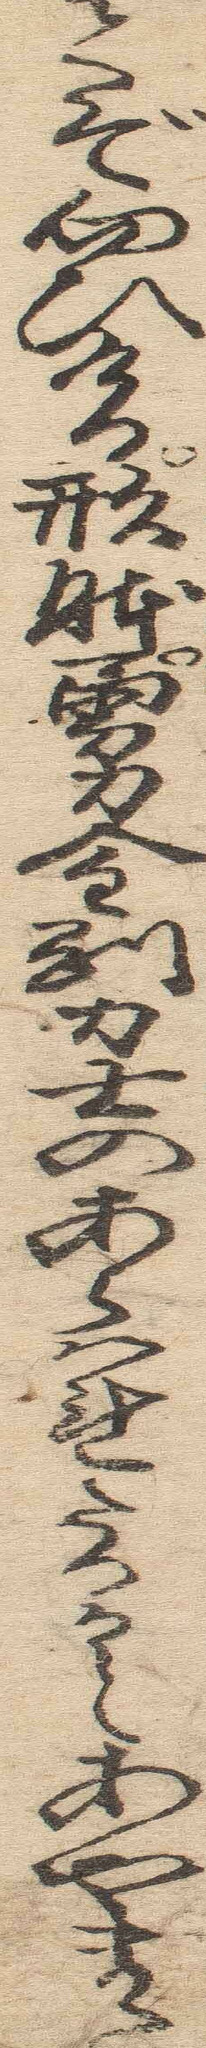てぞ向ひけり。形体勇力金剛力士のあらはれたるかとあやまりた
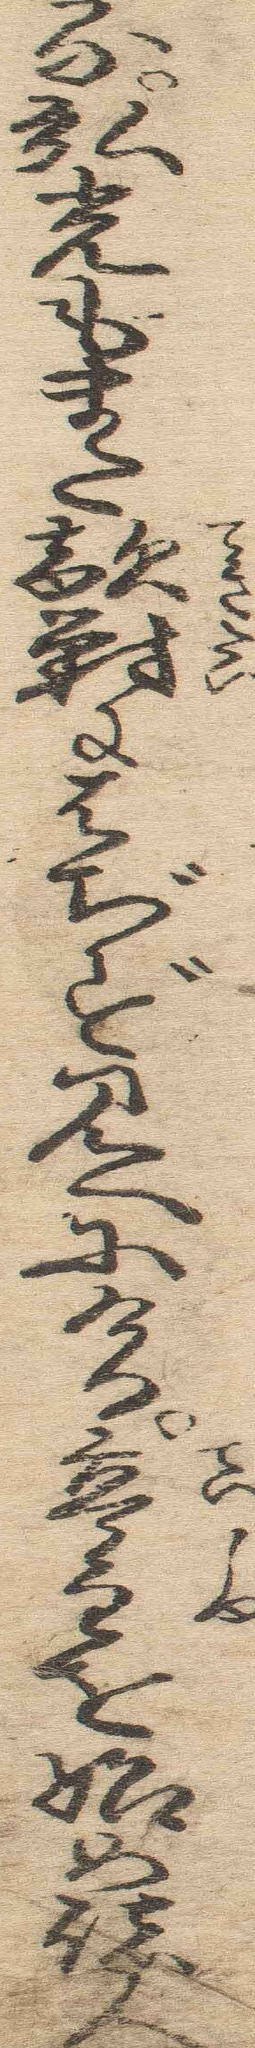る。弘光もまた敵対にはぢず見へにけり。亭主を始め諸人
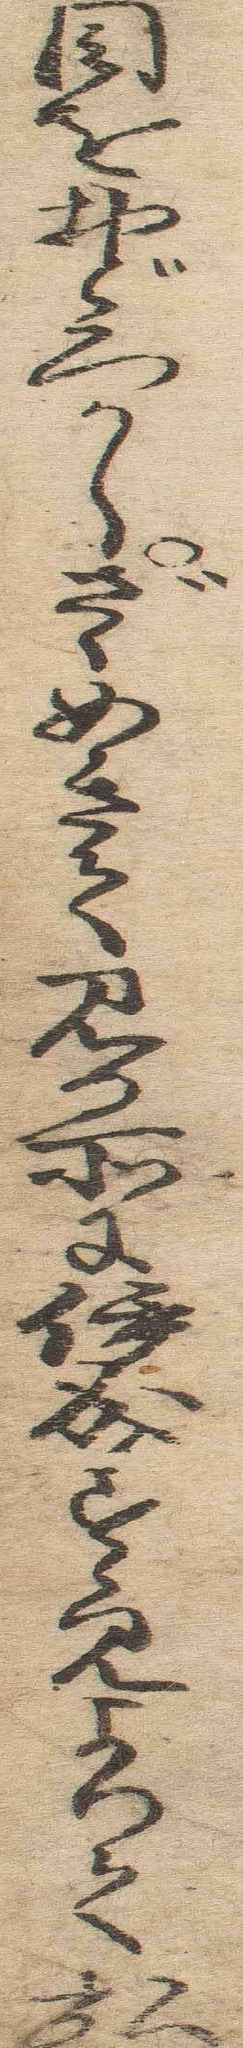目をおどろかし。ざくめきて見る所に伊成すゝみよりて弘

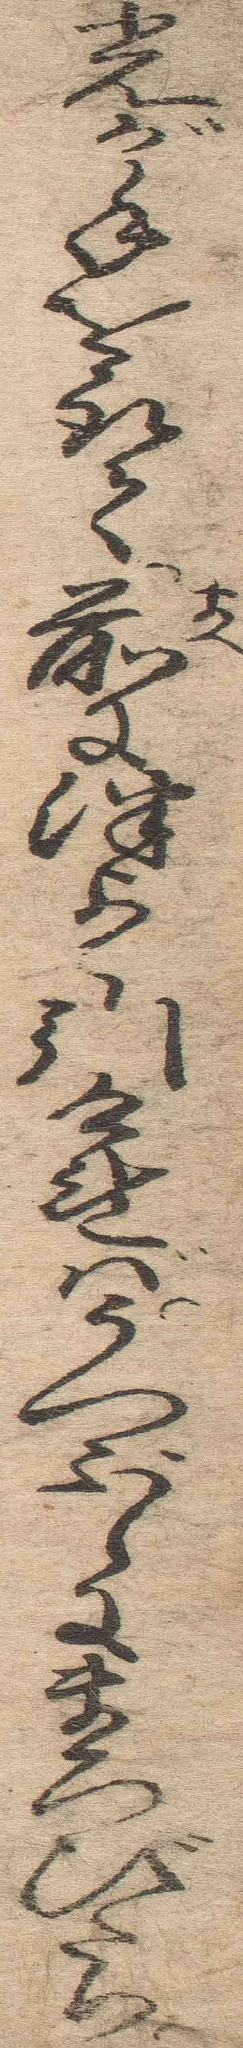光が手を取て。前につよく引ければ。うつぶしにまろびたり。
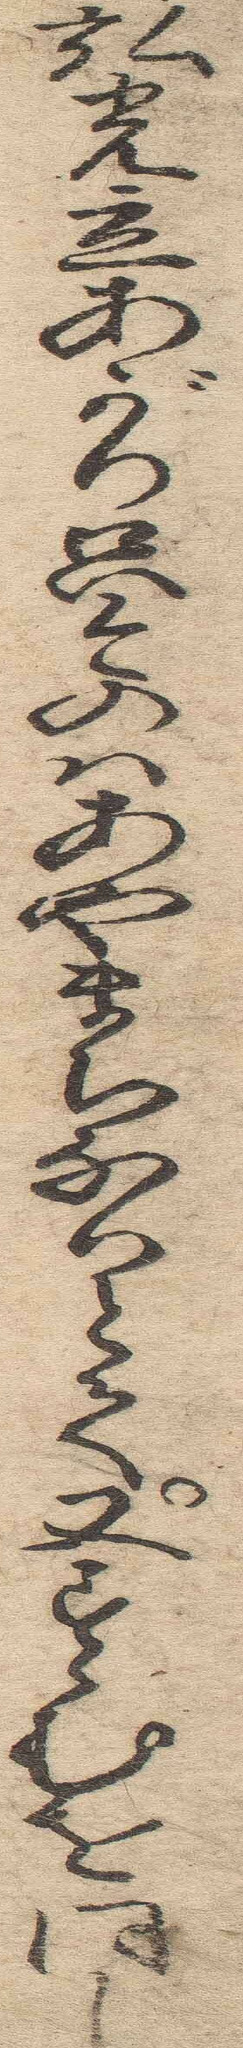弘光立あがり只今はあやまちなりとて。又すゝむを同じ
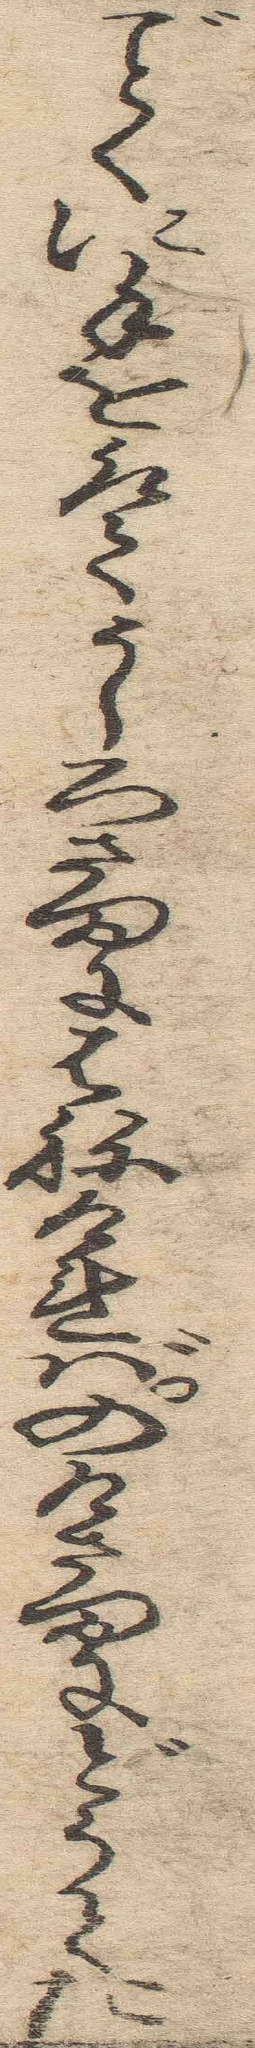ごとくに手を取てうしろさまにはねければ。のけさまにどうとた
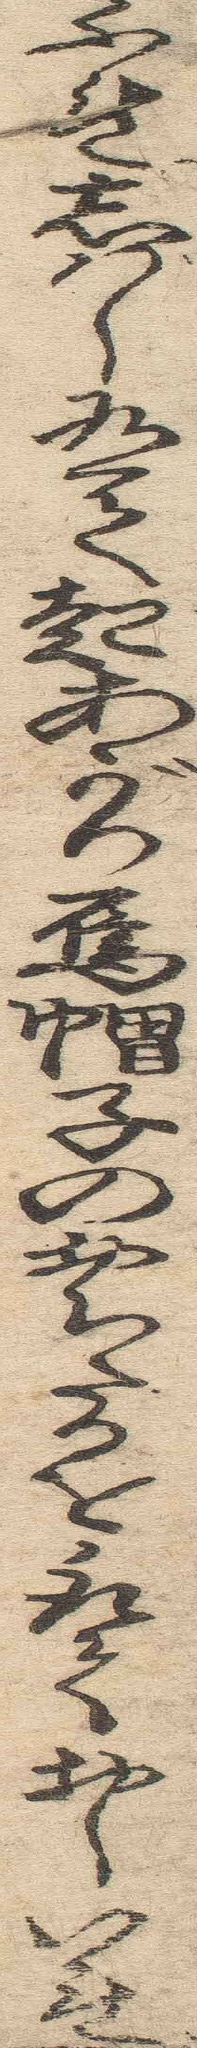ふれ。しばし有て起あがり烏帽子のおちたるを取ておしいれ
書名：古今相撲大全
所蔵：東京学芸大学附属図書館 国文学研究資料館
